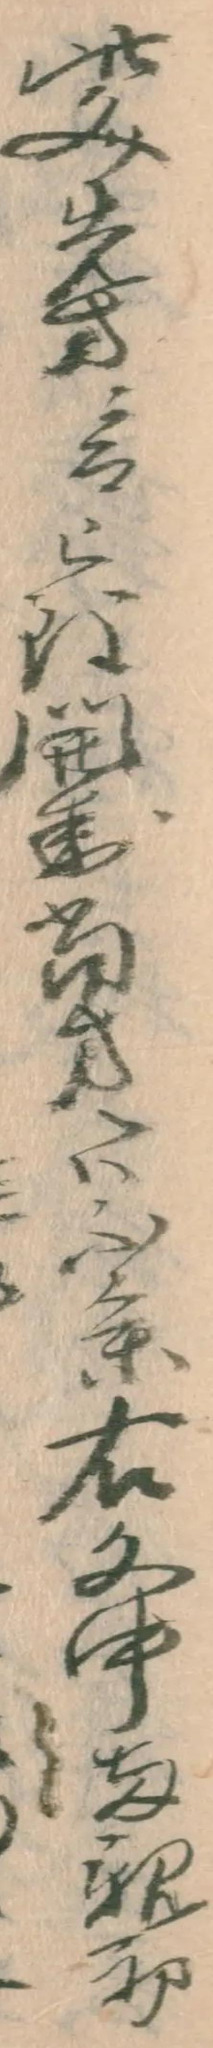此文先方ニ而被致開當方へハ不参右文中両親初
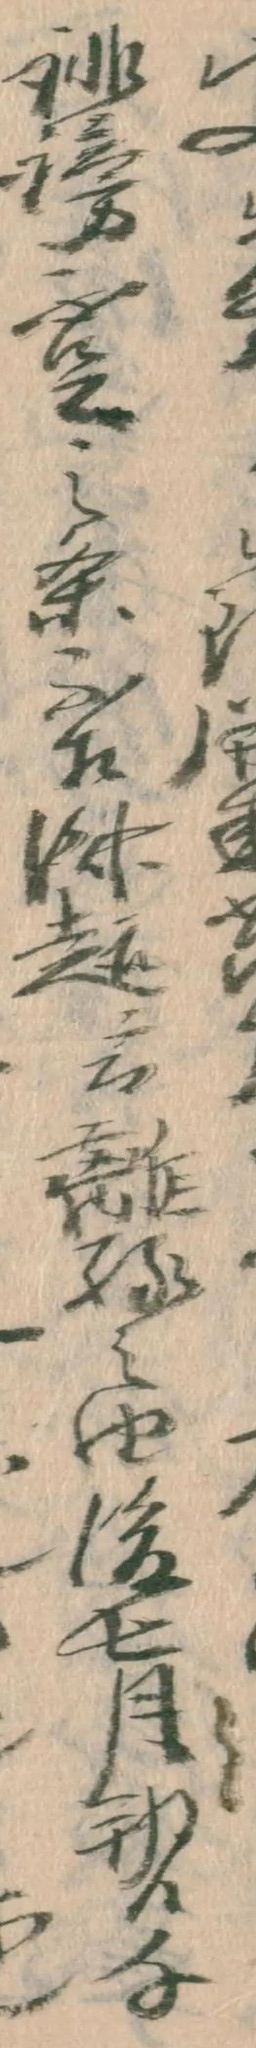誹謗不足之条不相済趣ニ而離縁之由後七月朔日千
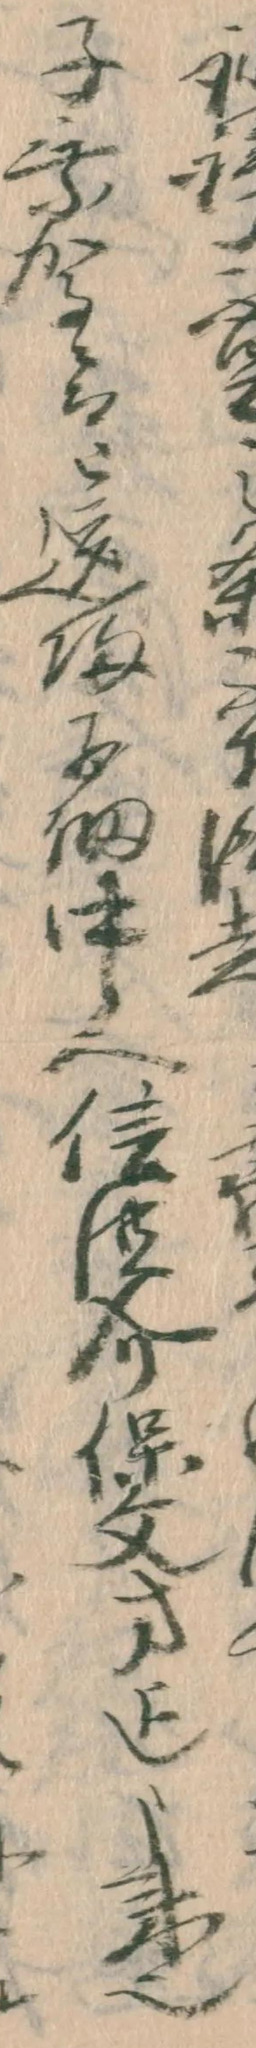子乗駕ニ而被送帰子細中へ信濃介保文方迄申来也
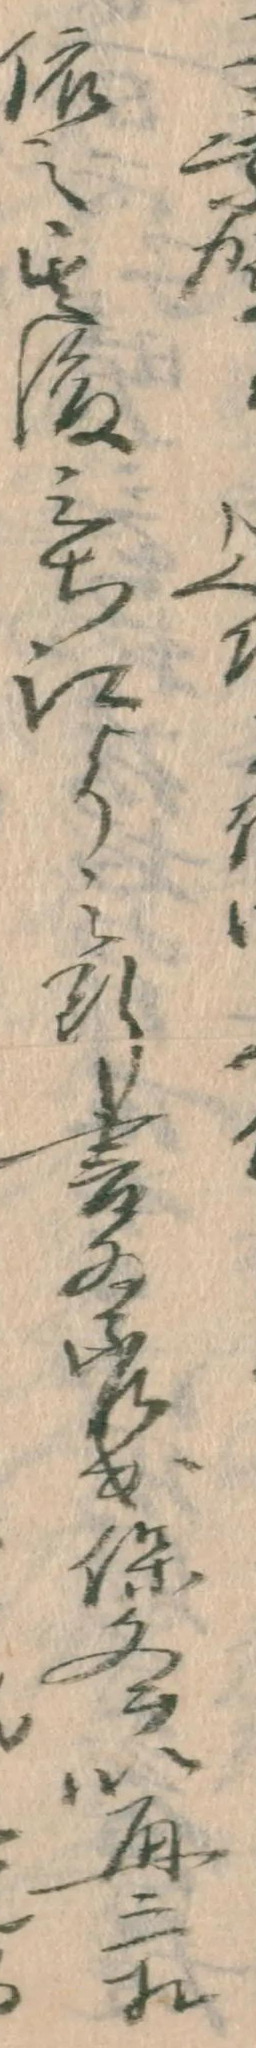依之其後みち江より之頭書為差出保文ヲ以再三相
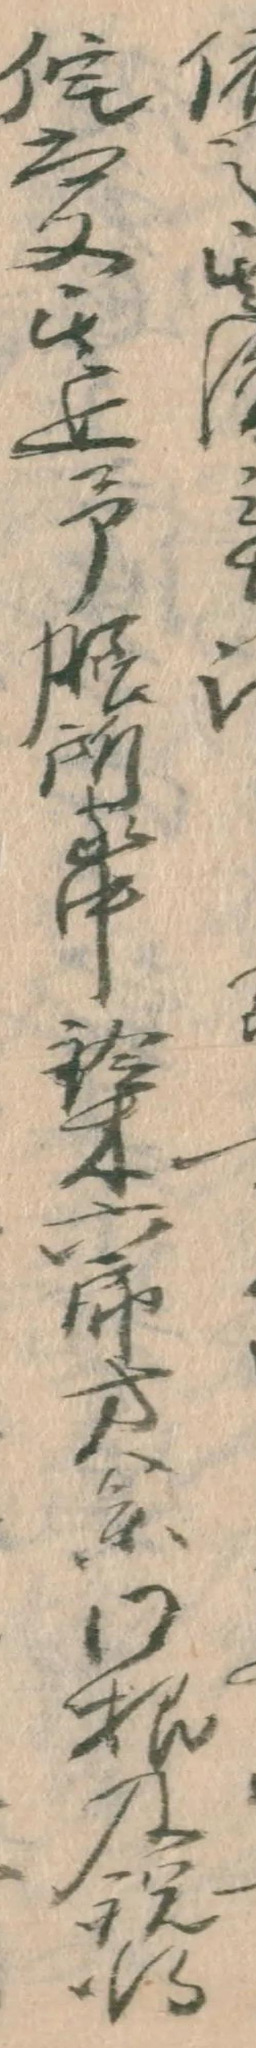侘尚又其上予膳所家中鈴木六郎方へ参同様及祝得
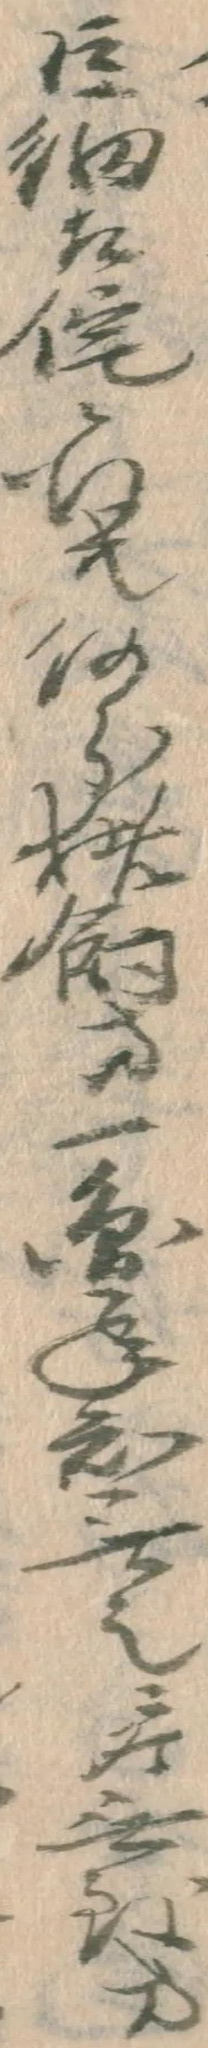巨細相詫候得共何分猪飼方一圖承知無之ニ付無致方
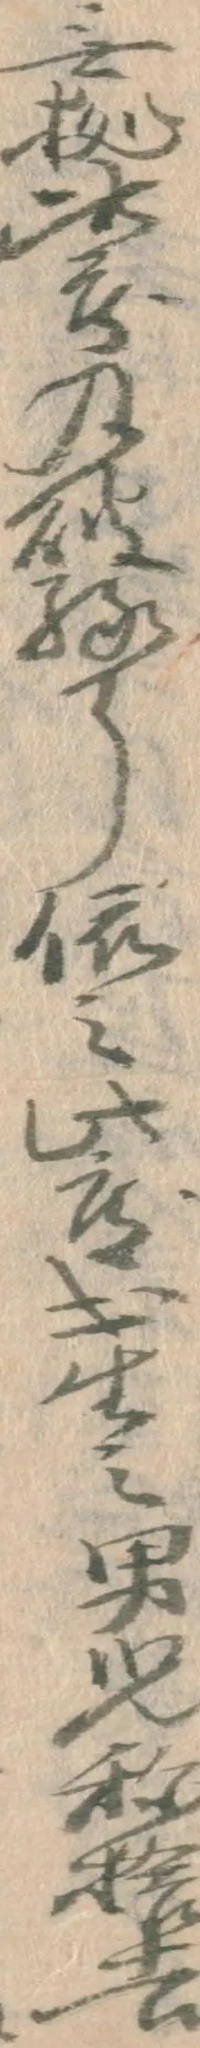無拠此度及破縁了依之此度出生之男児称捨告
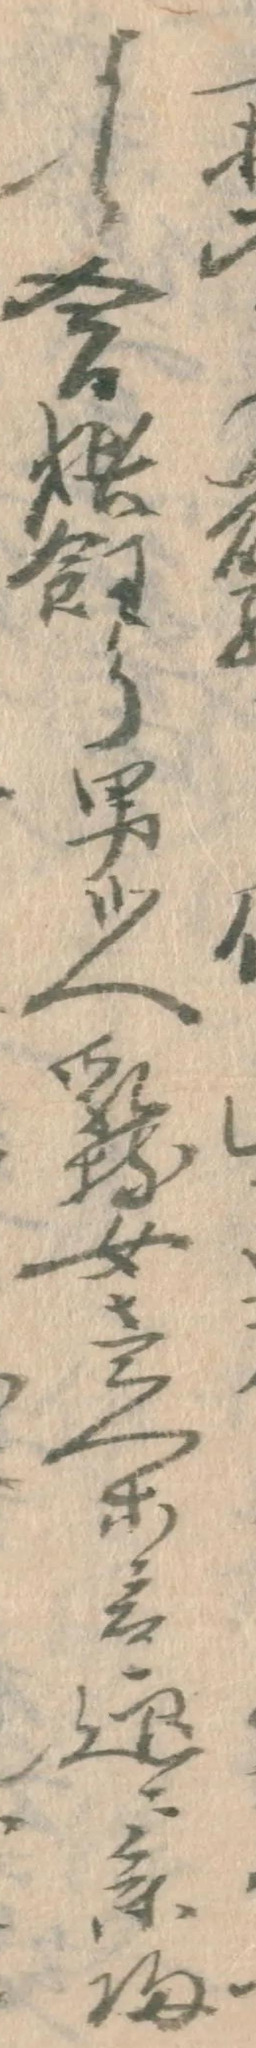よし今日猪飼より男弐人乳持女壱人等ニ而迎ニ参帰
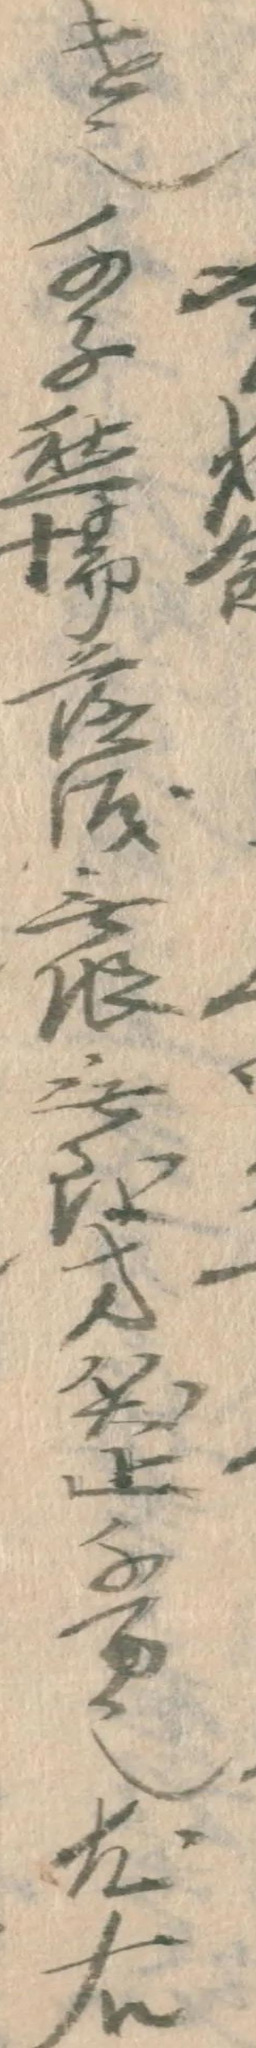遣也千子愁傷落涙無限無致方笑止千万也尤右
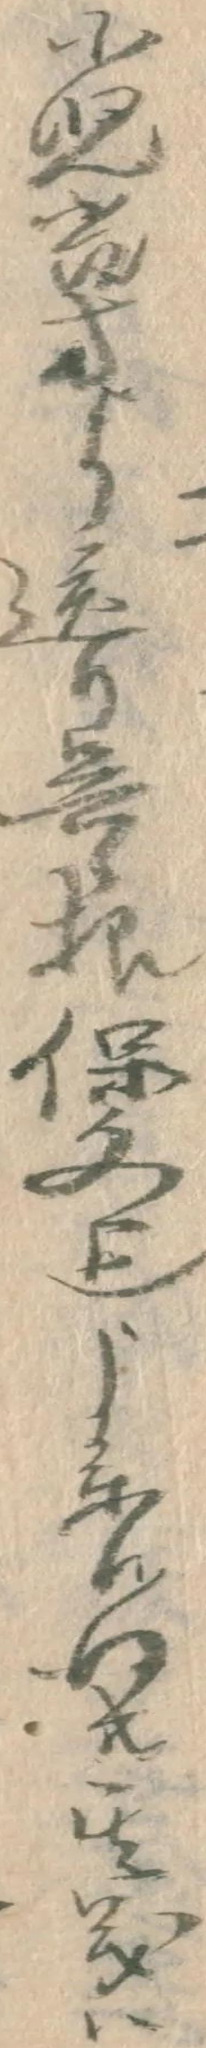小児當方より送り呉候様保文迄申参候得共其義ハ
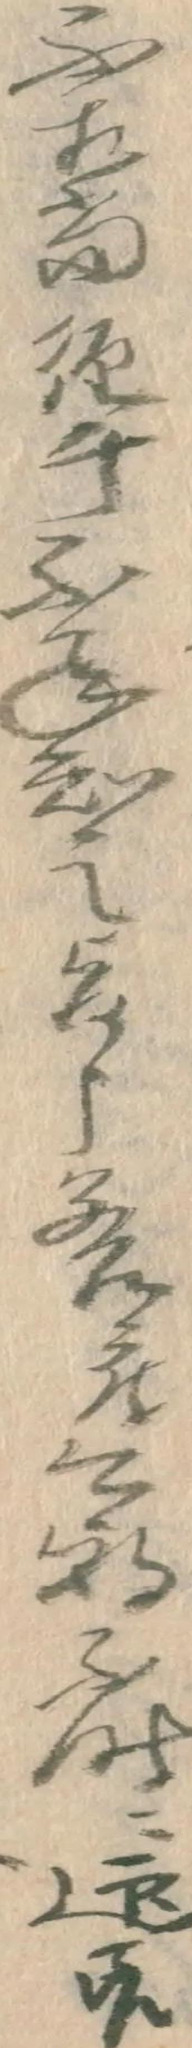不相當経千不承知之旨申答ニ付今朝不時に迎請
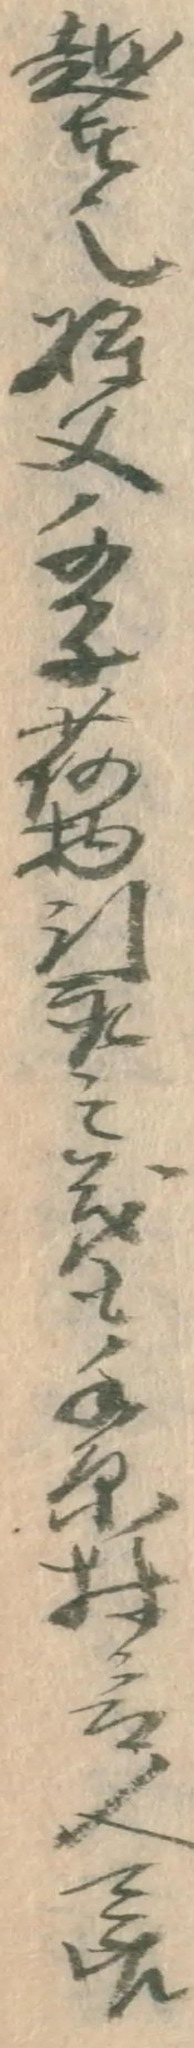趣者也将又千子荷物引取之義も手原村ニ而人可差

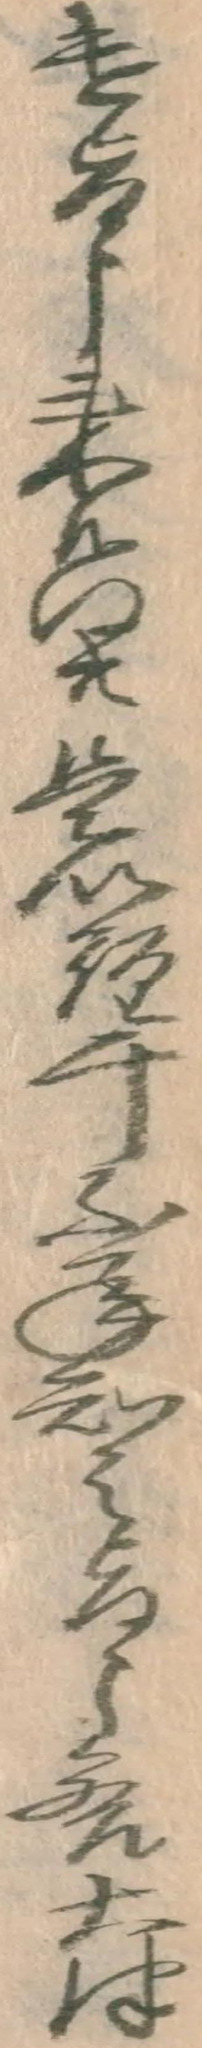遣旨申来候得共是以経千不承知之旨申答大津
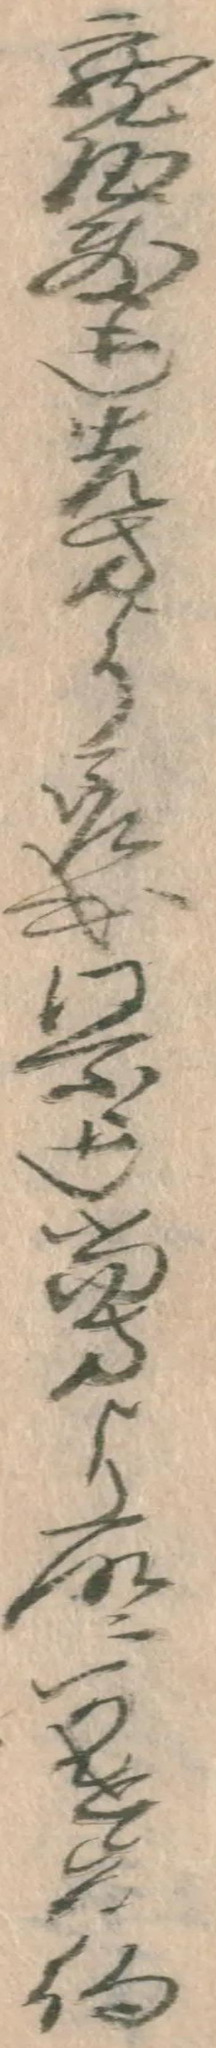蔵屋敷迄先方より差出同所迄當方より一所二可遣旨約
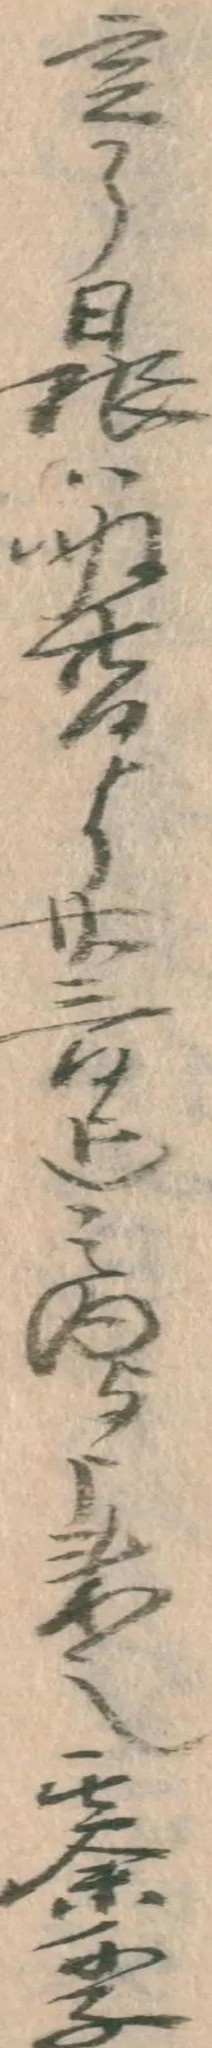定了日限ハ明廿日より廿三日迄之内と申来也其余余千子
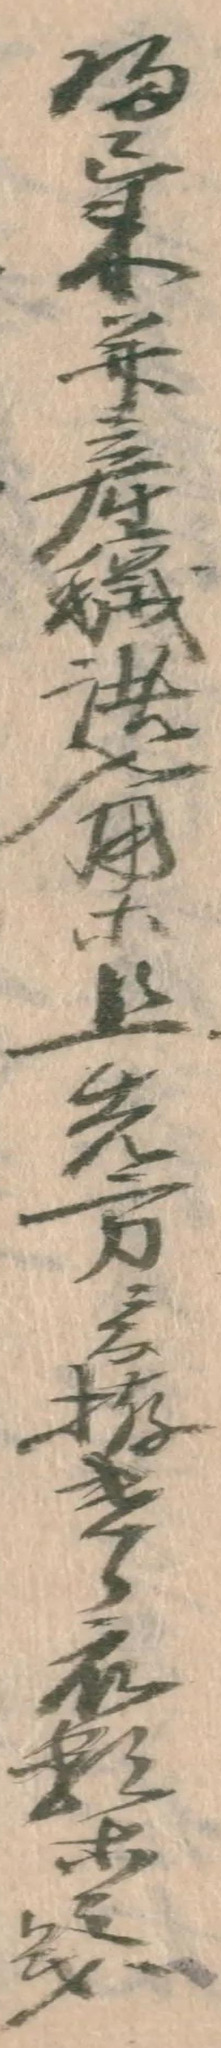帰已来并産穢諸入用等且先方ニ而拵遣候衣類等之義
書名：賀茂社記録. 第67冊
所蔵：国立国会図書館 National Diet Library, JAPAN
